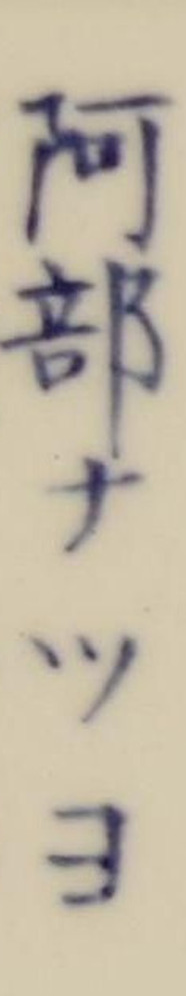阿部ナツヨ
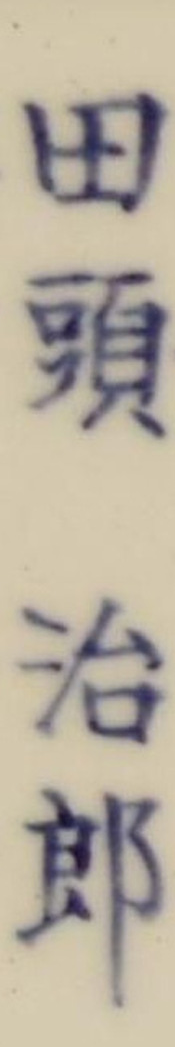田頭治郎
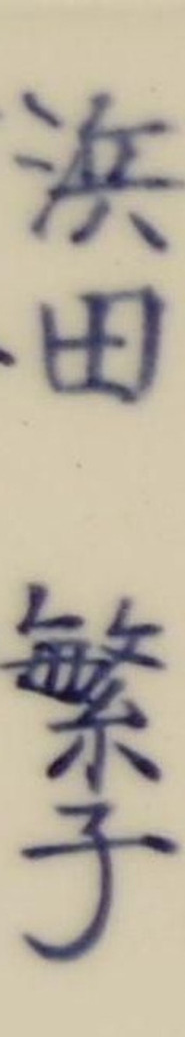浜田繁子
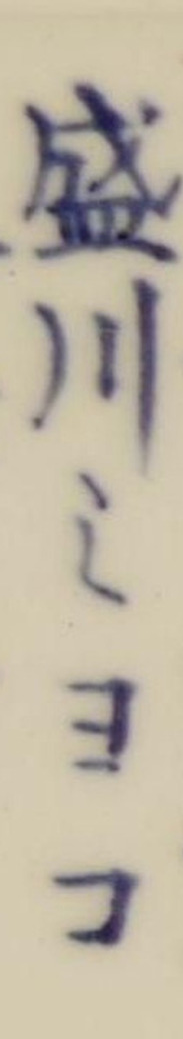盛川ミヨコ
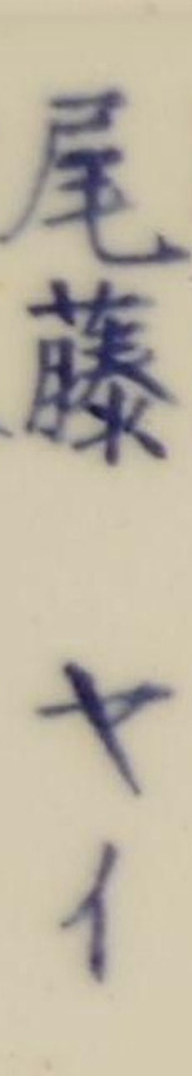尾藤ヤイ
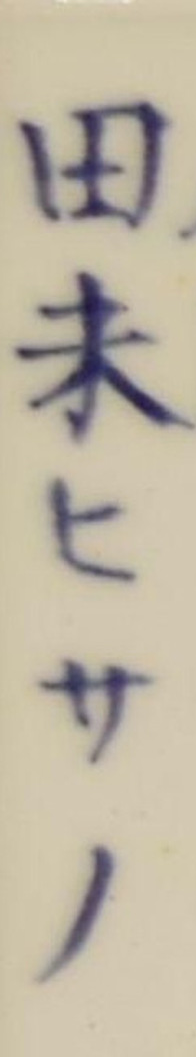田未ヒサノ

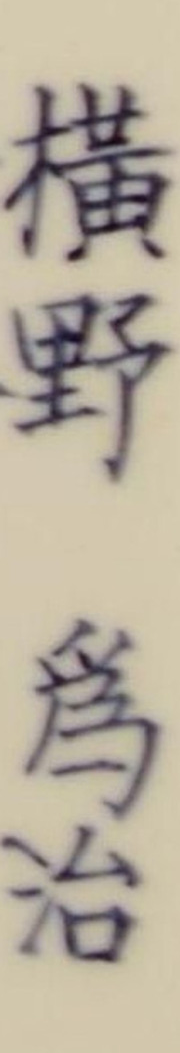横野為治
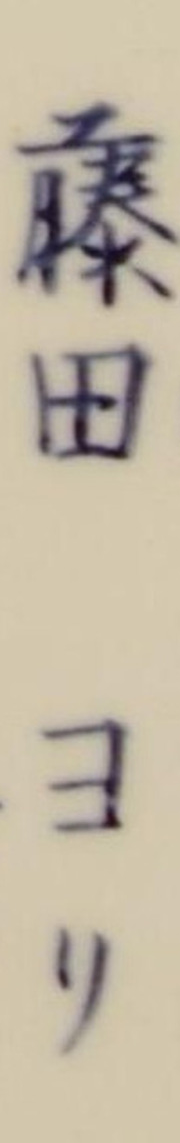藤田ヨリ
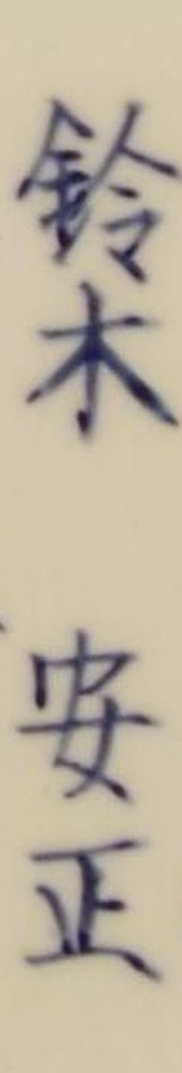鈴木安正
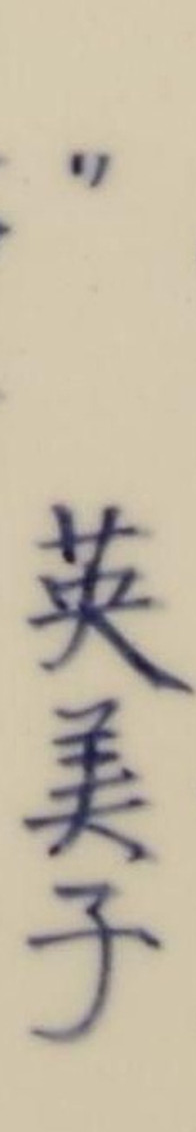英美子
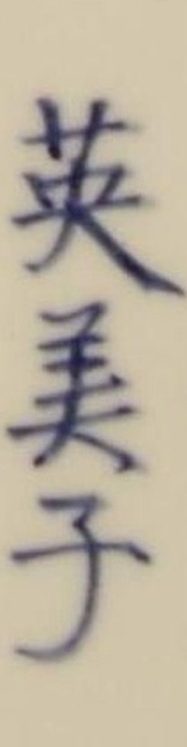英美子
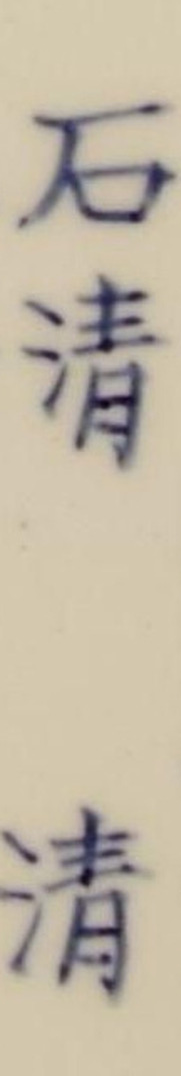石清清
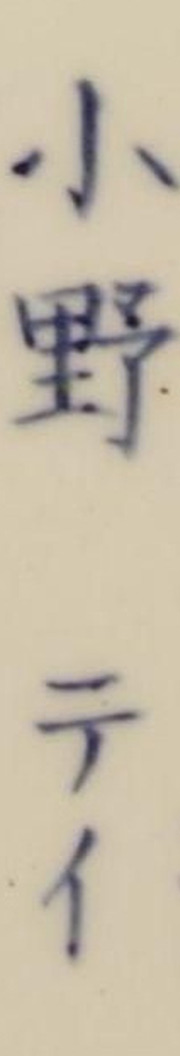小野テイ
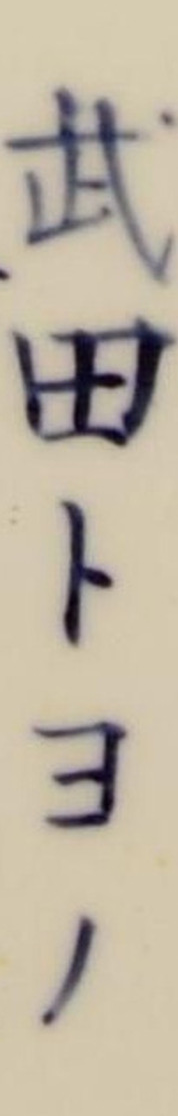武田トヨノ
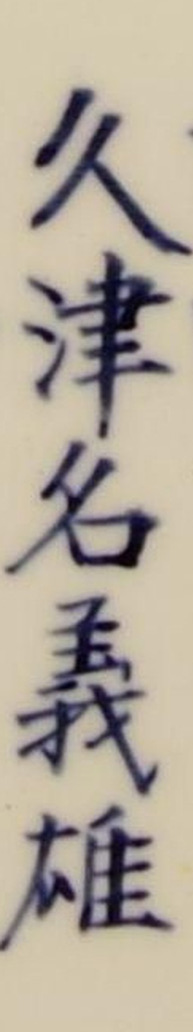久津名義雄
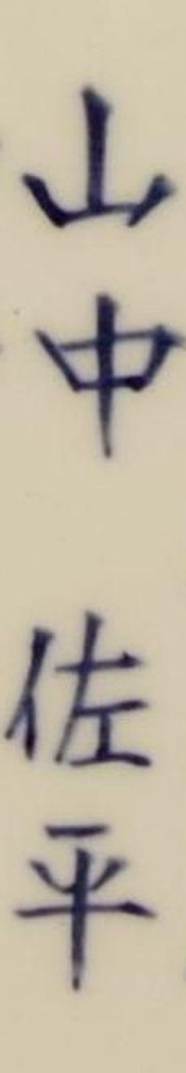山中佐平
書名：E~L
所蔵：高野山金剛峯寺
